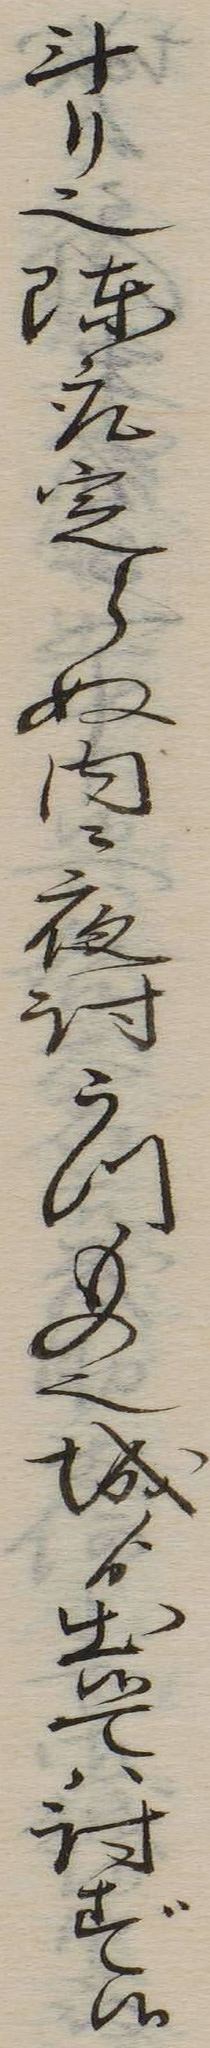計り也陣取定らぬ内ニ夜討うつもの也城ゟ出候ては討ず候
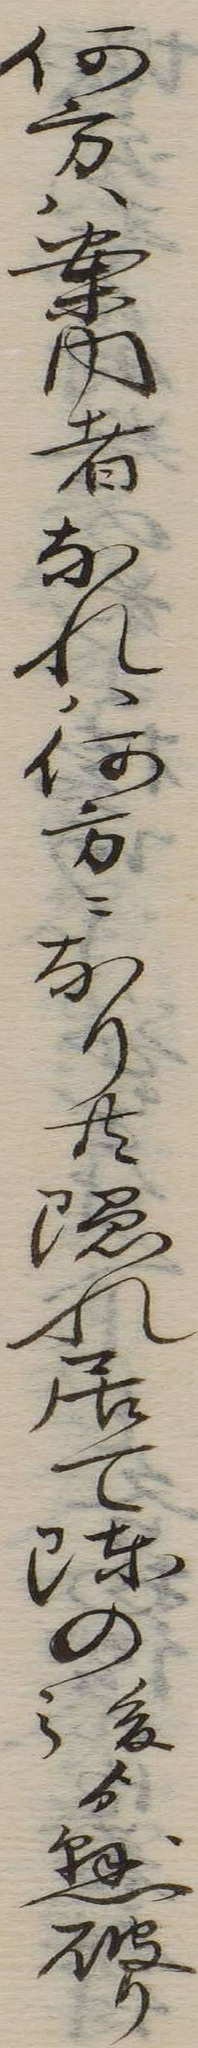何方は案内者なれは何方ニなり共隠れ居て陣の後ゟ懸破り
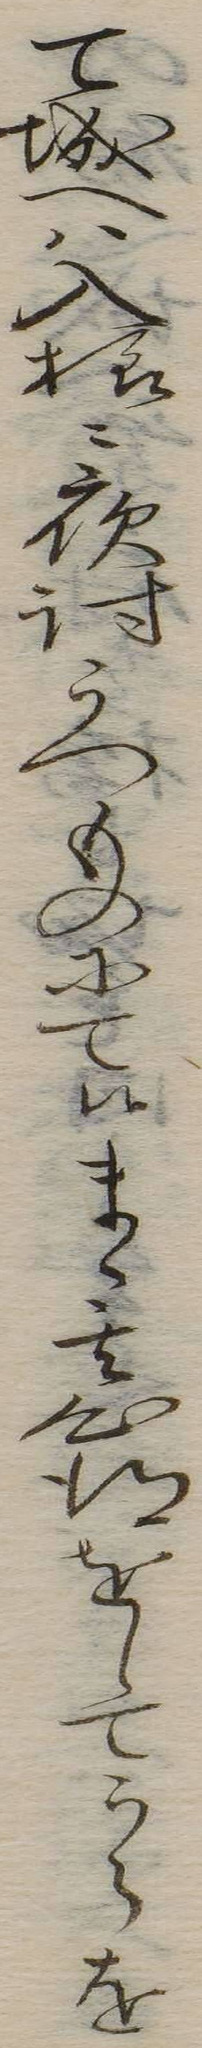て城へは入様ニ夜討うつものにてはまゝ其心得をしてうらを
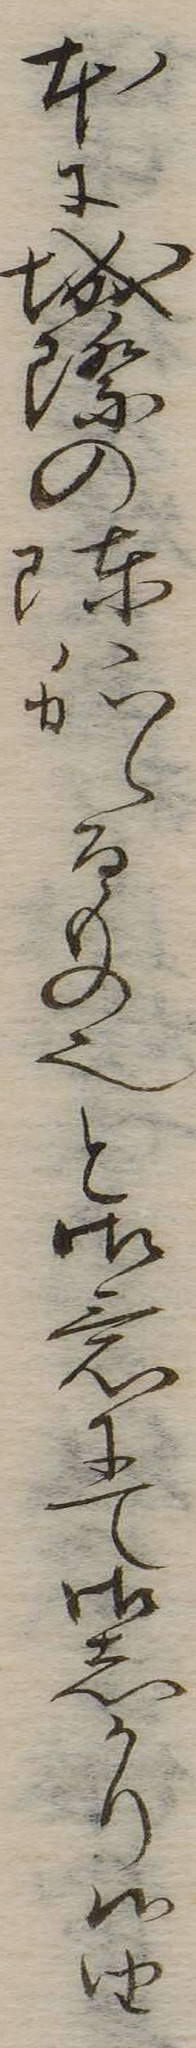本に城際の陣はからるもの也と御意にて御しかり候由

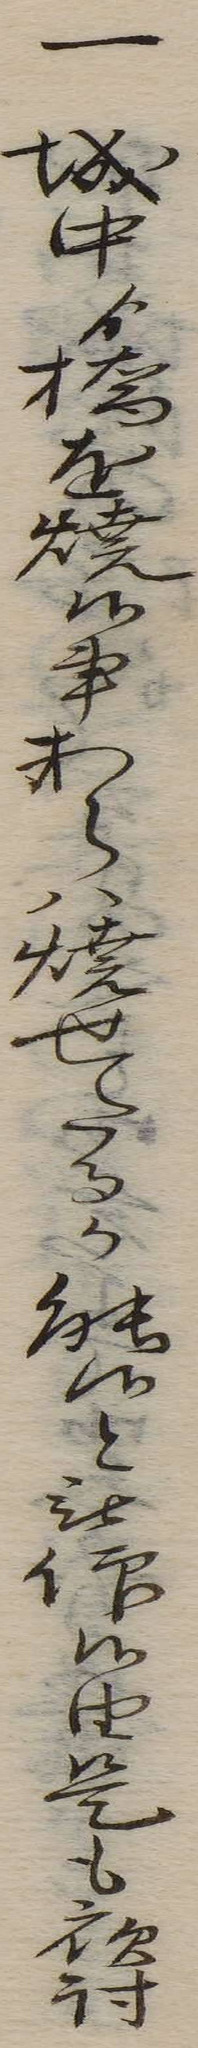一城中ゟ橋を焼候事あらは焼せたるか能候と被仰候由是も夜討
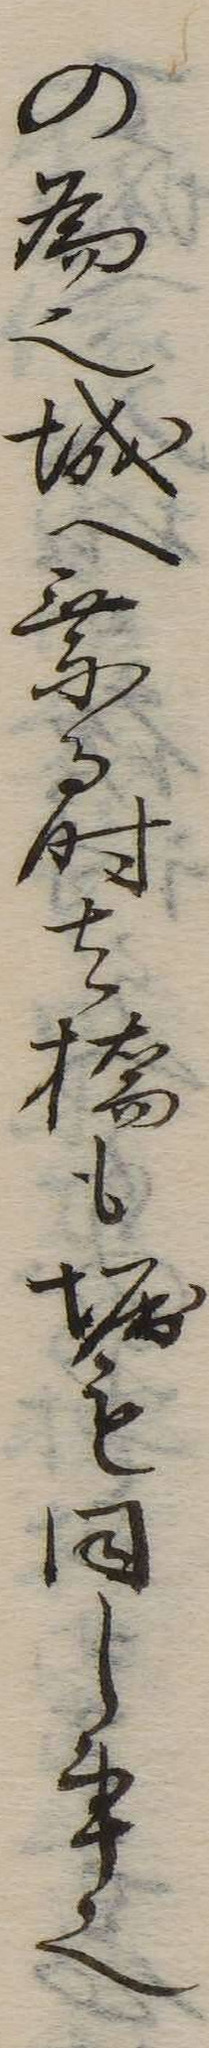の為也城へ乗る時は橋も堀も同し事也
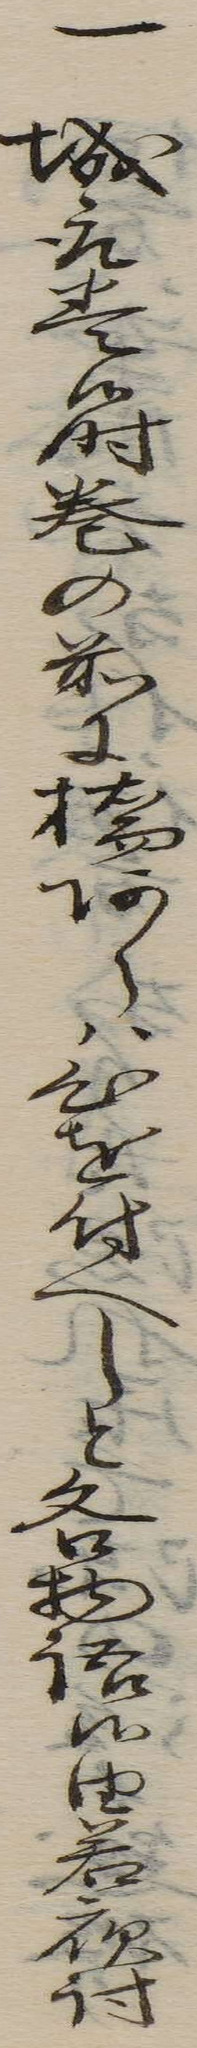一城取巻候時巻の前に橋あらは心を付へしと各物語候由若夜討
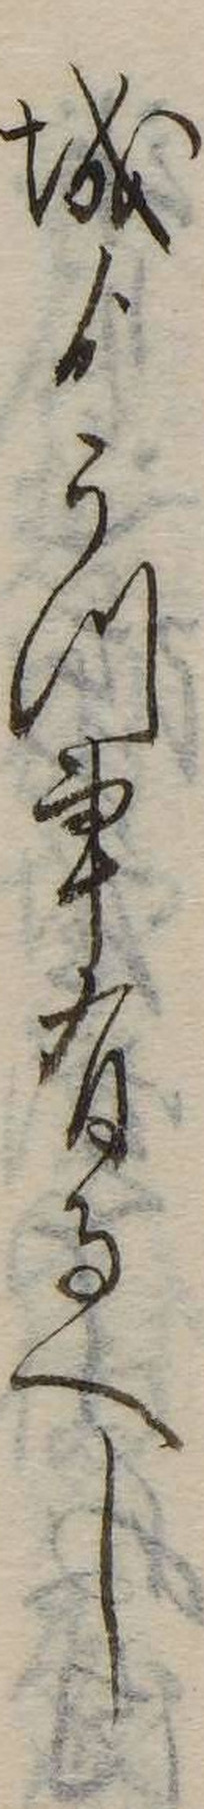城ゟうつ事有るへし
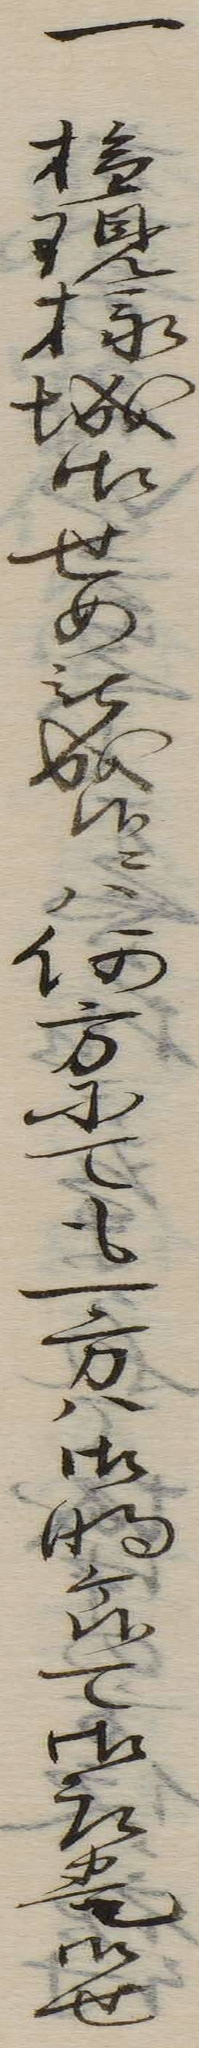一権現様城御せめ被成候ニハ何方にても一方は御明け候て御取巻候せ
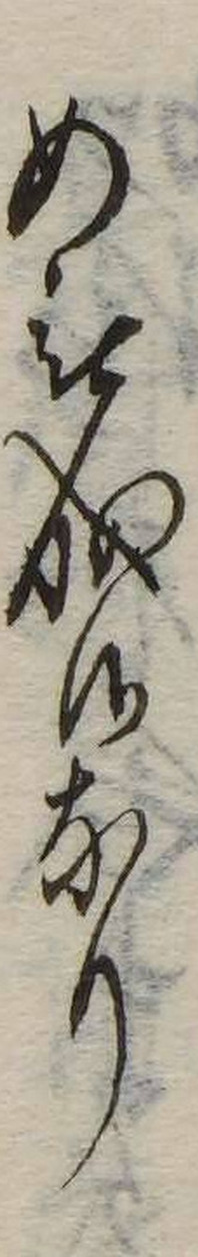め被成候なり
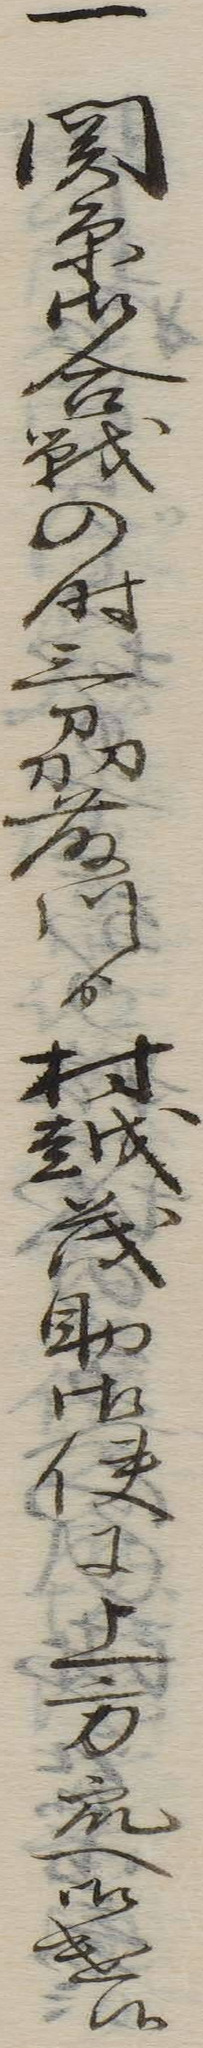一関原御合戦の時三州藤川ゟ村越茂助御使に上方衆へ御遣候
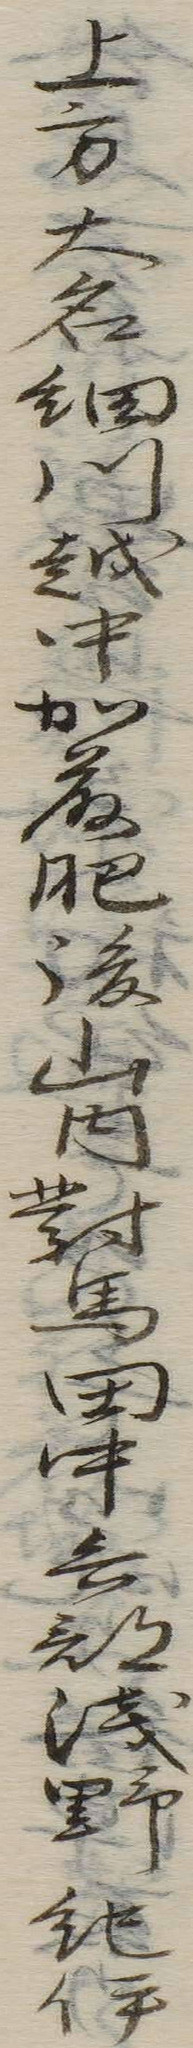上方大名細川越中加藤肥後山内対馬田中兵部浅野紀伊
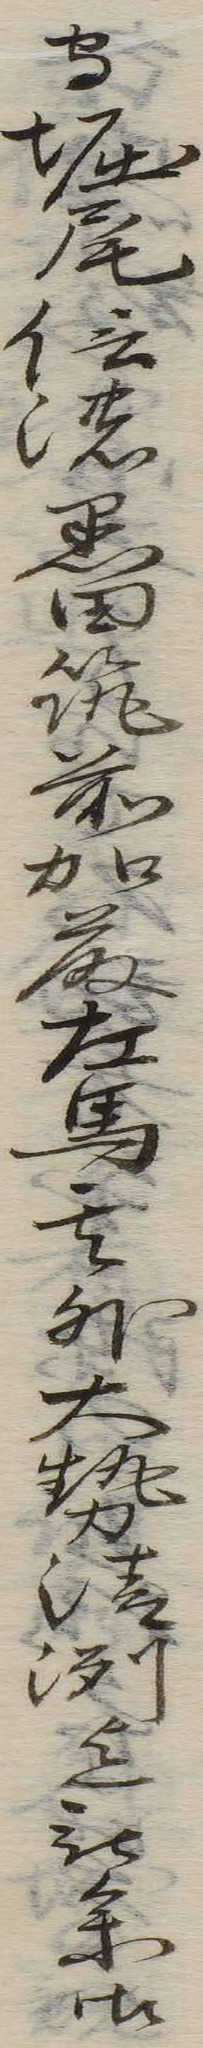守堀尾信濃黒田筑前加藤左馬其他大勢清冽迄被参御
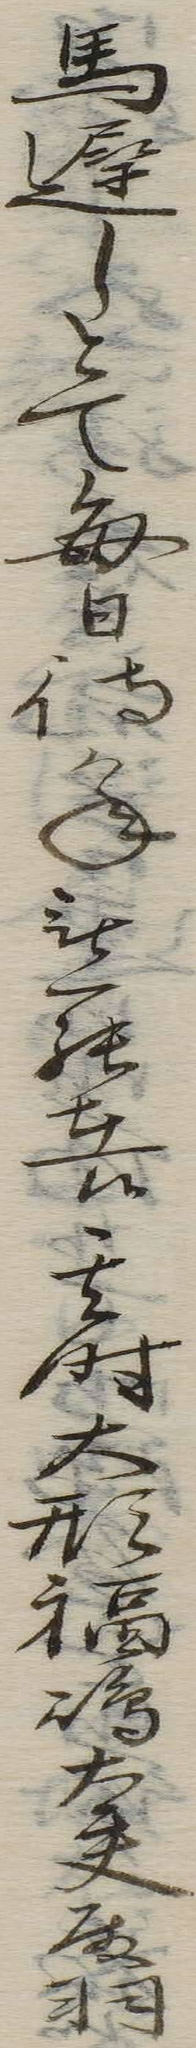馬遅しとて毎日待かね被罷在候其時大形福嶋太夫殿羽
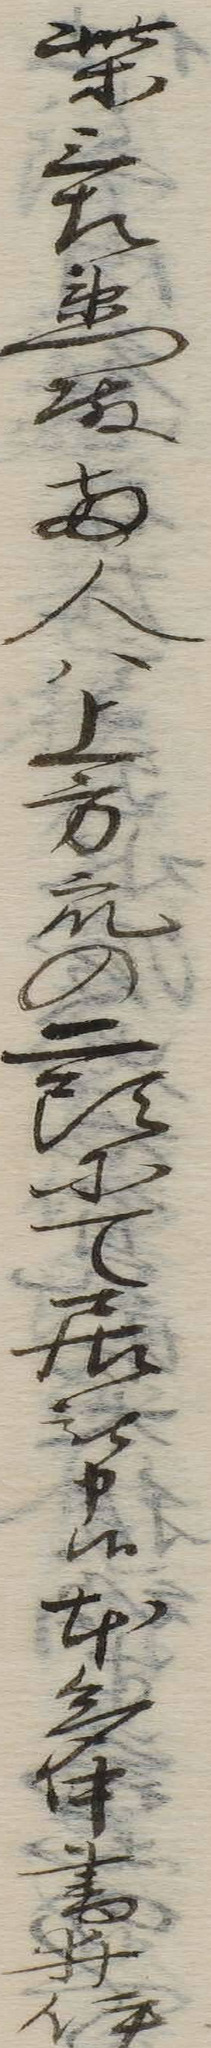柴三左衛門殿両人は上方衆の二頭にて居被申候本多中書井伊
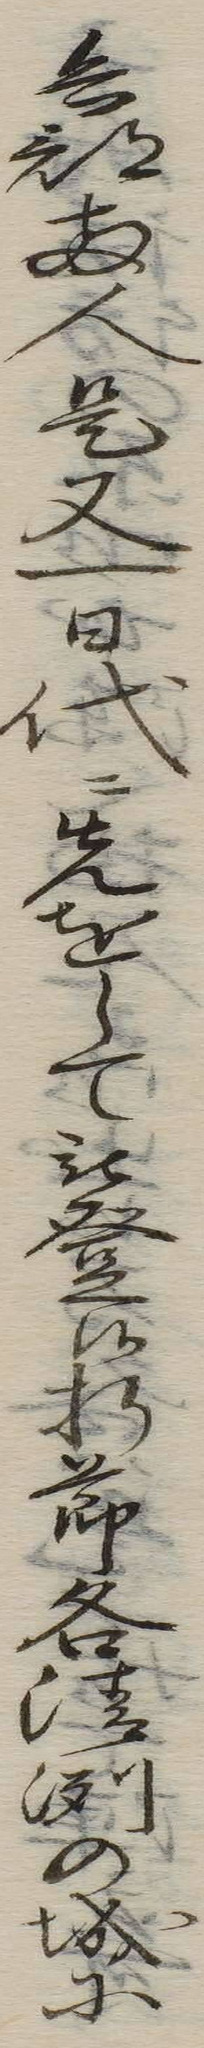兵部両人是又一日代ニ先をして被登候折節各清冽の城に
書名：三河之物語
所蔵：国文学研究資料館
